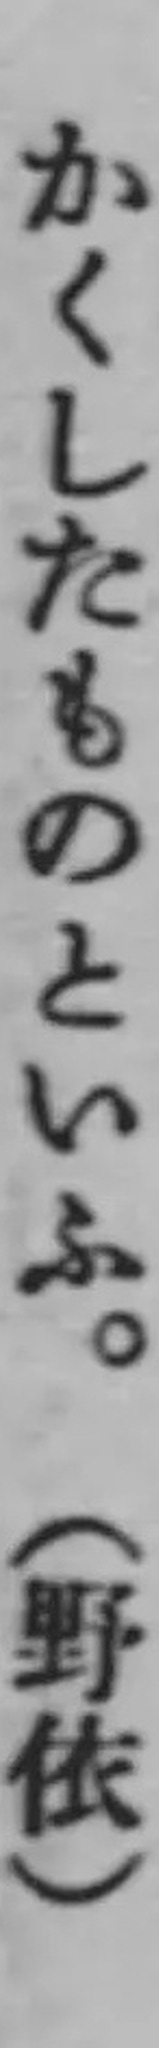かくしたものといふ。(野依)
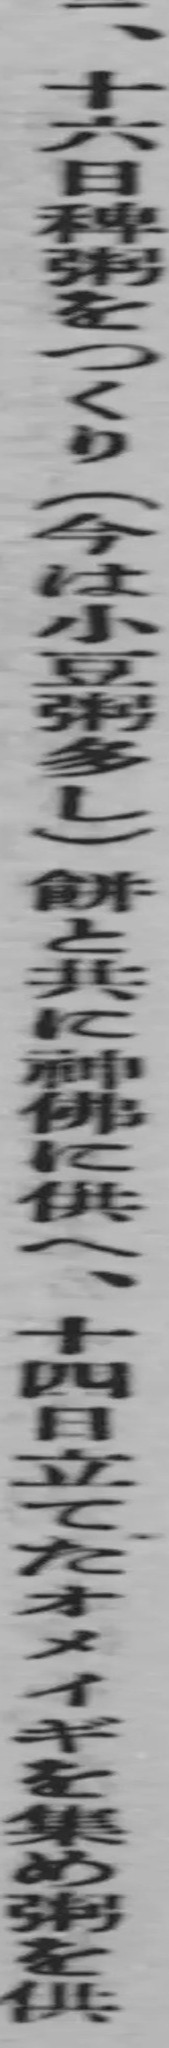ニ、十六日稗粥をつくり(今は小豆粥多し)餅と共に神佛に供へ、十四日立てたオメイドを集め粥を供
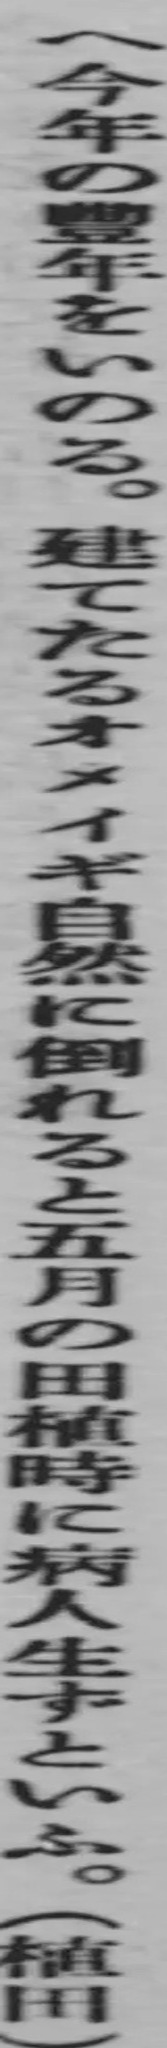へ今年の豊年をいのる。建てたるオメイギ自然に倒れると五月の田植時に病人生ずといふ。(植田)
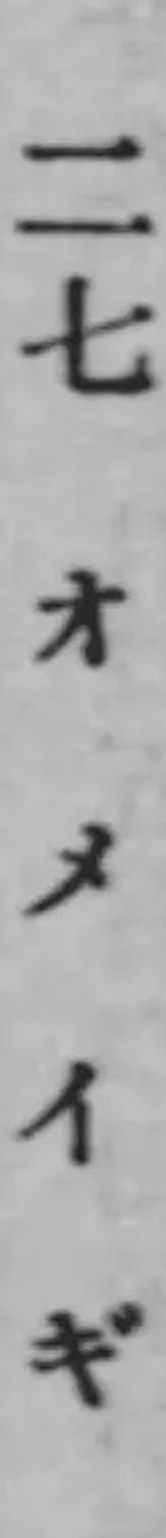二七オメイギ
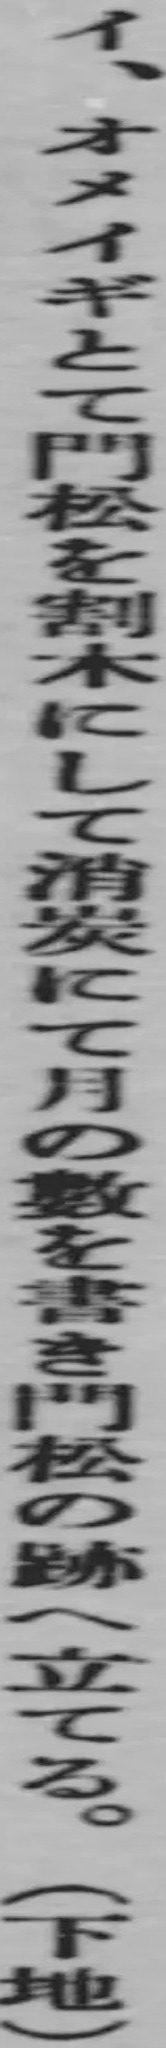イ、オメイギとて門松を割木にして消炭にて月の數を書き門松の跡へ立てる。(下地)
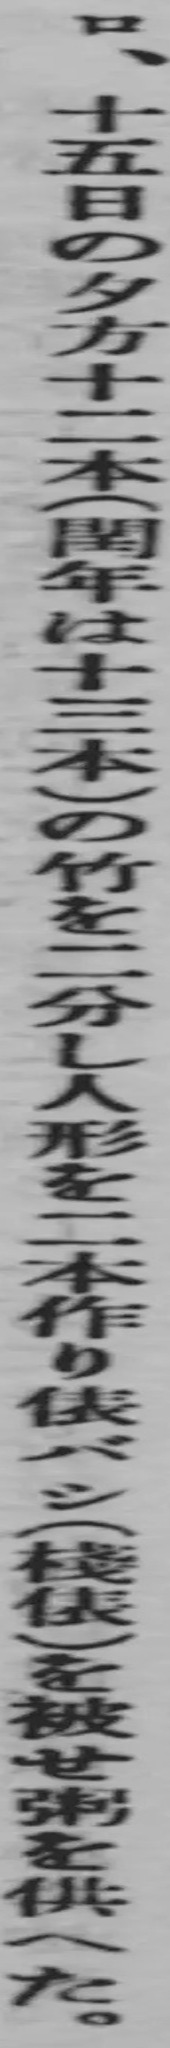ロ、十五日の夕方十二本(閏年は十三本)の竹を二分し人形を二本作り俵バシ(棧俵)を被せ粥を供へた。
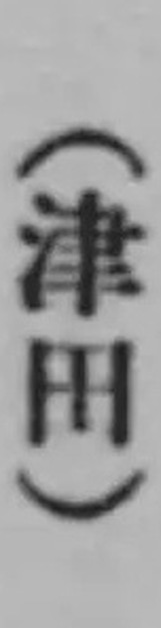(津田)
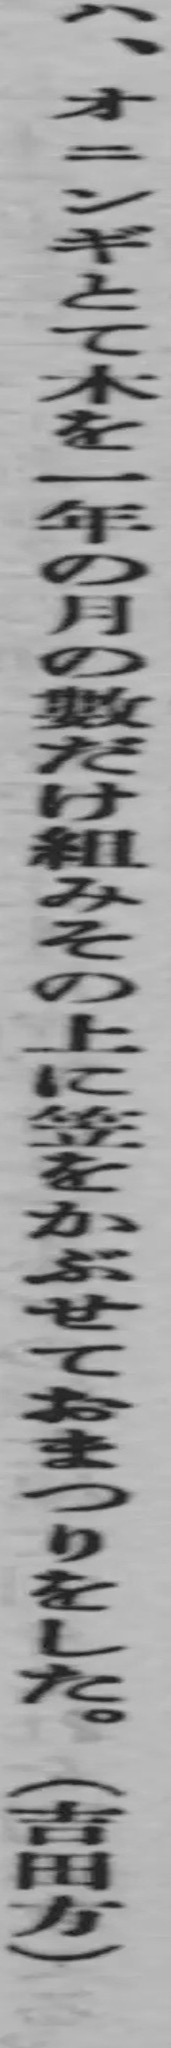ハ、オニンギとて木を一年の月の數だけ組みその上に笠をかぶせておまつりをした。(吉田方)

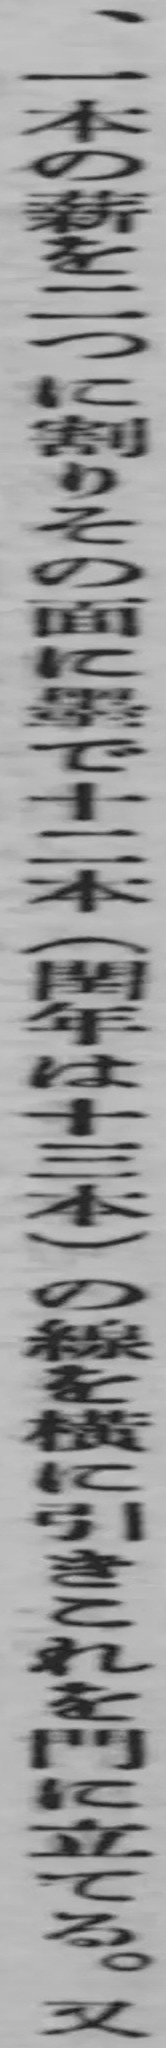ニ、一本の薪を二つに割りその面に墨で十二本(閏年は十三本)の線を引きこれを門に立てる。又
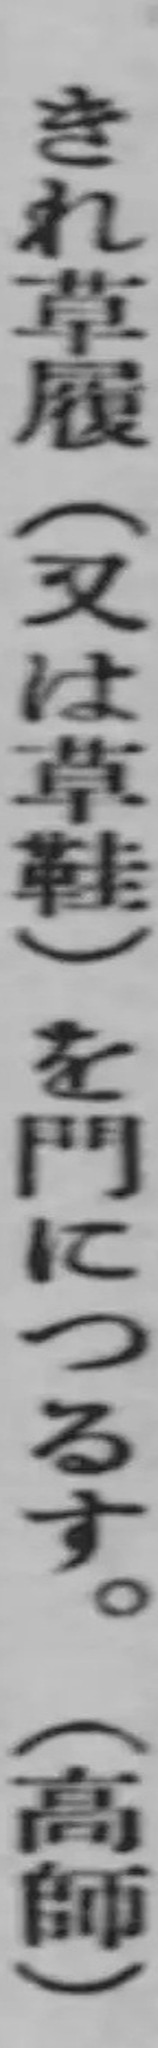きれ草履(又は草履)を門につるす。(高師)
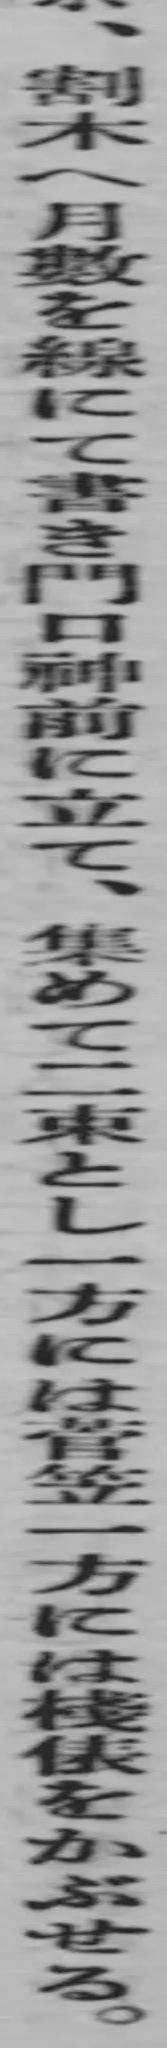ホ、割木へ月數を線にて書き門口神前に立て、集めて二束とし一方には菅笠一方には棧俵をかぶせる。
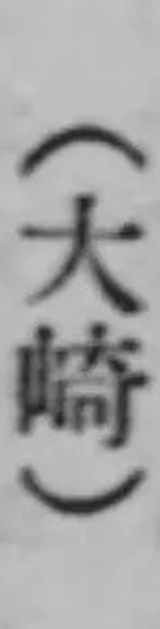(大崎)
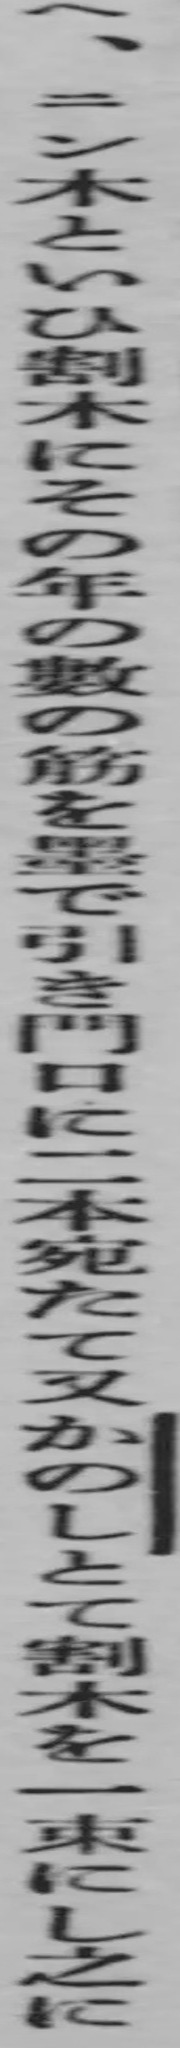ヘ、ニン木といひ割木にその年の數の筋を墨で引き門口に二本宛たて又かのしとて割木を一束にし之に
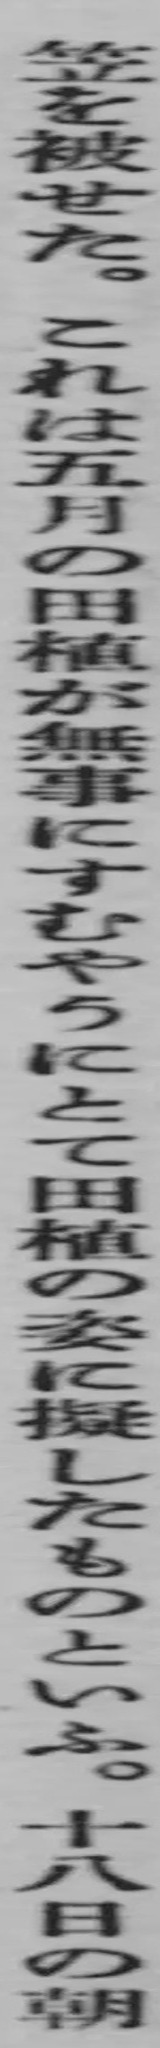笠を被せた。これは五月の田植が無事にすむやうにとて田植の姿に擬したものといふ。十八日の朝
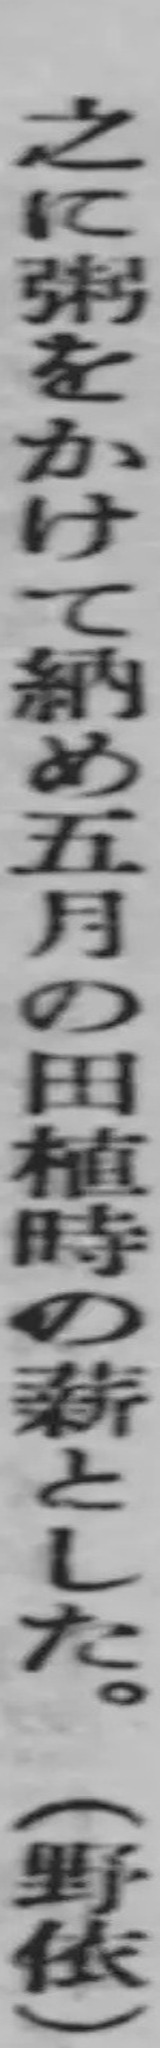之に粥をかけて納め五月の田植時の薪とした。(野依)
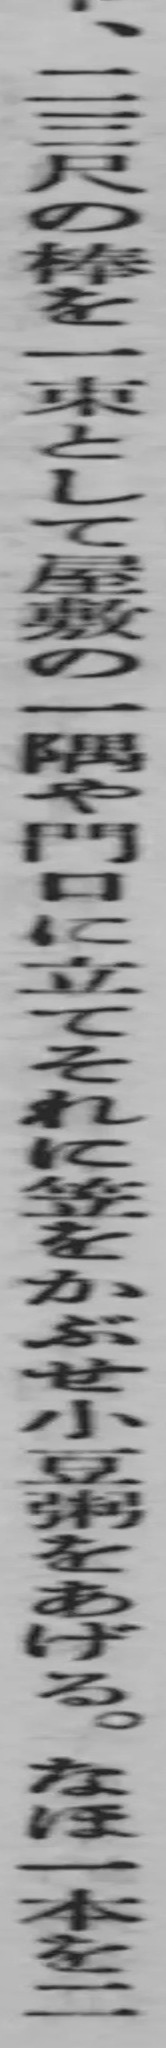ト、二三尺の棒を一束として屋敷の一隅や門口に立てそれに笠をかぶせ小豆粥をあげる。なほ一本を二
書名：豊橋の年中行事
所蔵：国立国会図書館 National Diet Library, JAPAN
